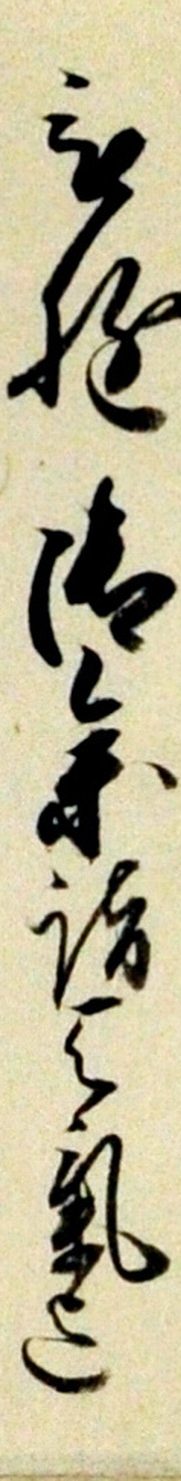被遊御参詣天気迄
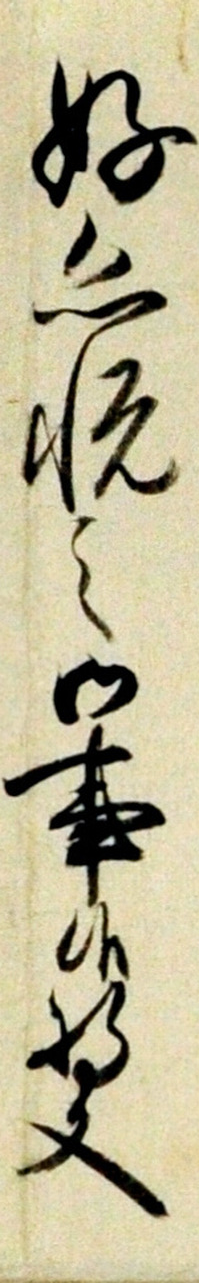好恐悦之御事候将又
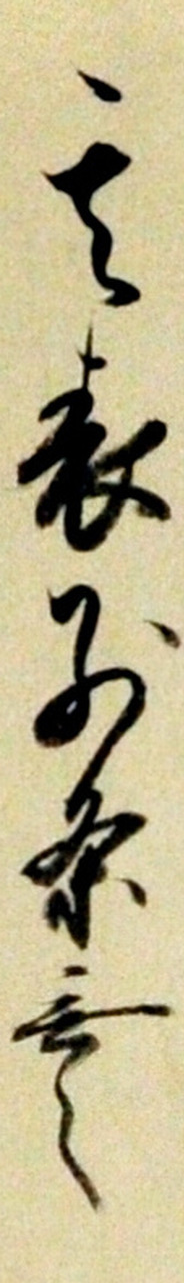其表別条無之
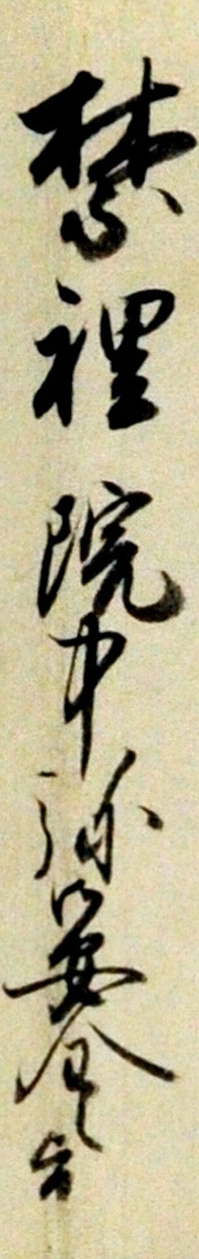禁裡院中弥御安全之旨
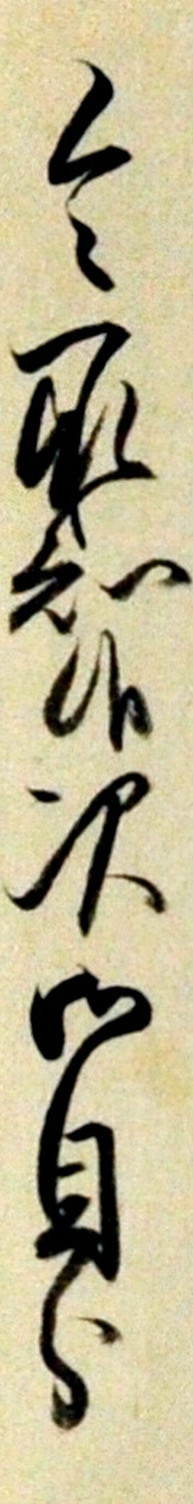令承知候次御自分
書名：書状
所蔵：伊那市立高遠町図書館・合同会社AMANE
